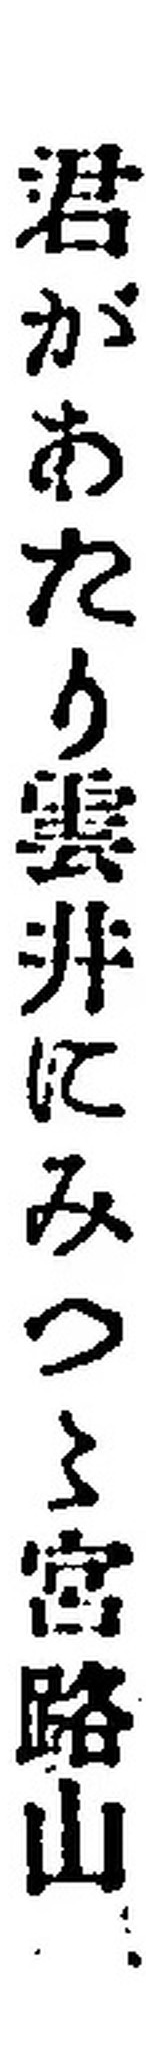君があたり雲井にみつゝ宮路山
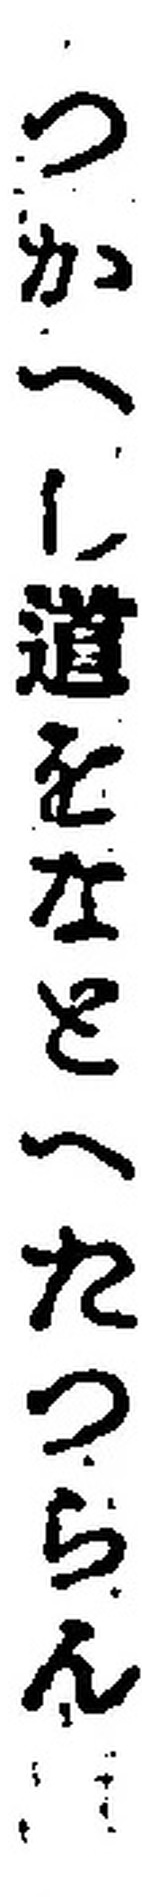つかへし道をなとへたつらん
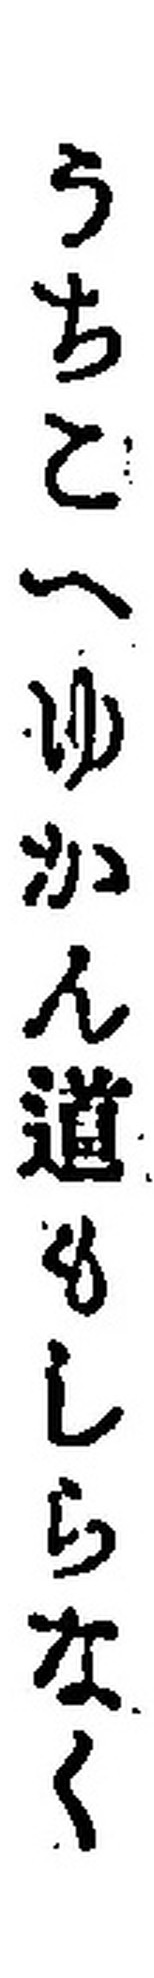うちこへゆかん道もしらなく
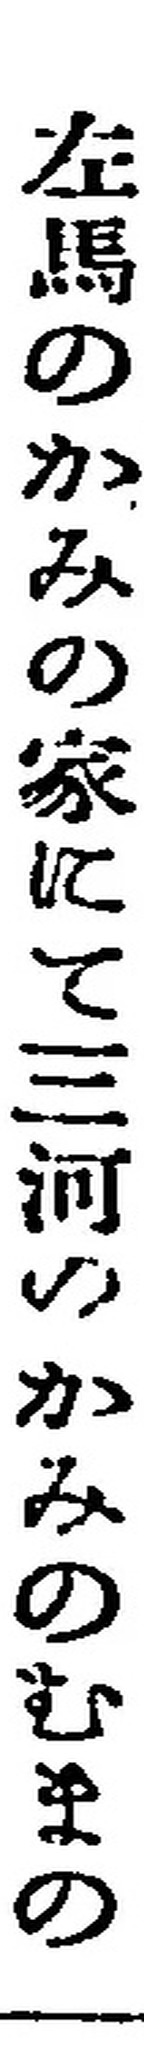左馬のかみの家にて三河のかみのむまの
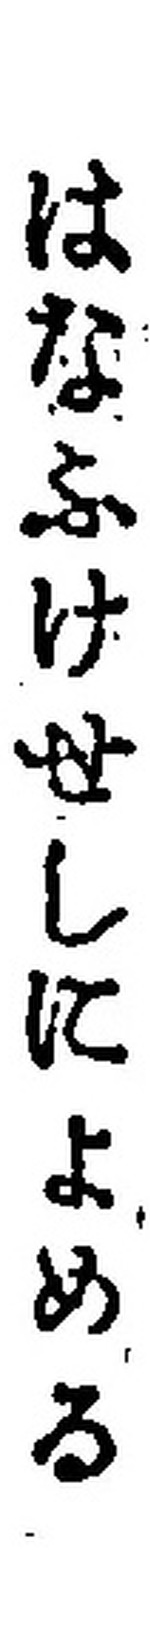はなふけせしによめる
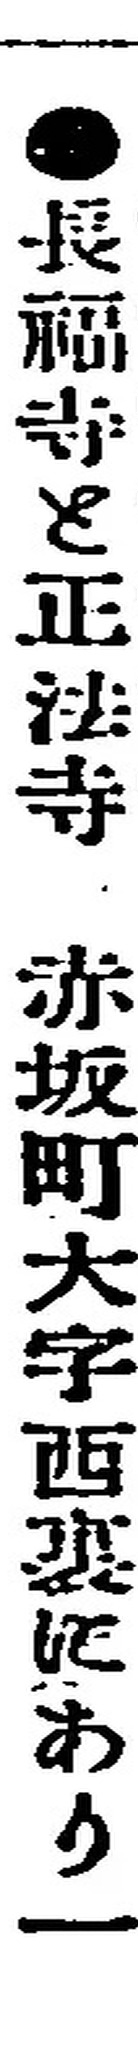●長福寺と正法寺赤坂町大字西裏にあり一
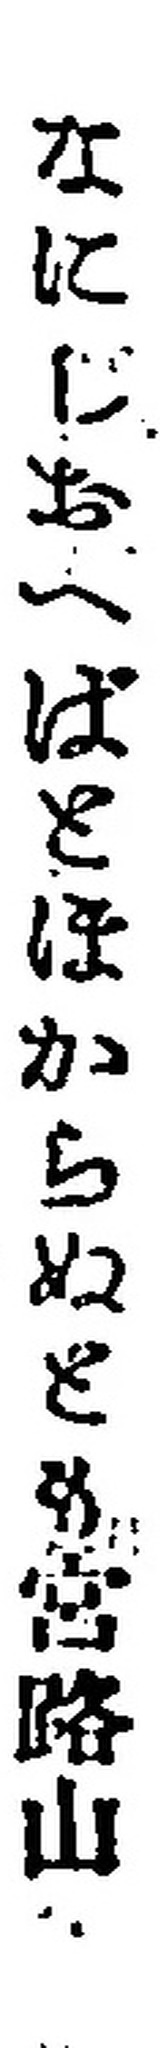なにしおへばとほからぬとも宮路山
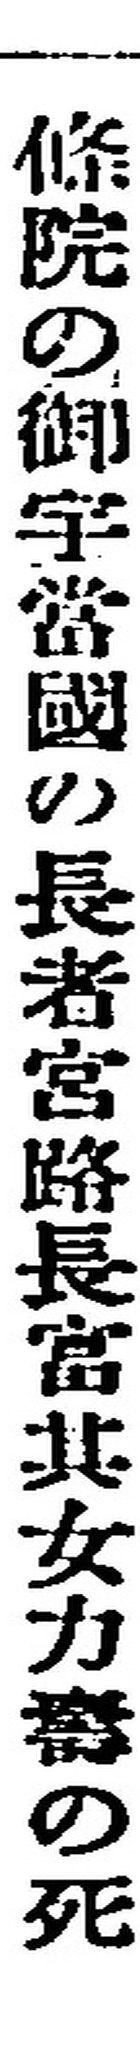条院の御宇当国の長者宮路長富其女力寿の死
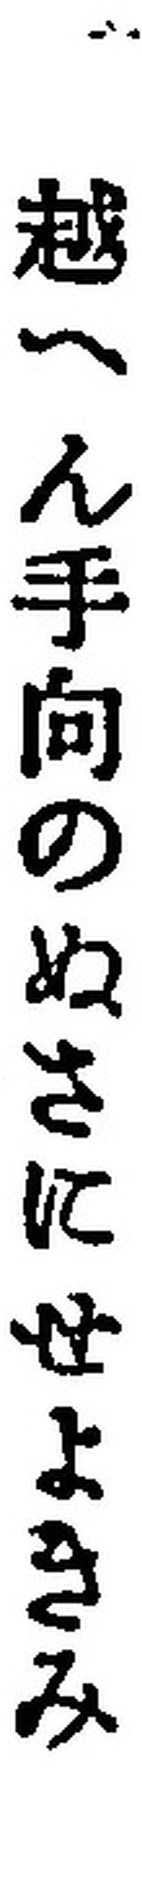越へん手向のぬさにせよきみ
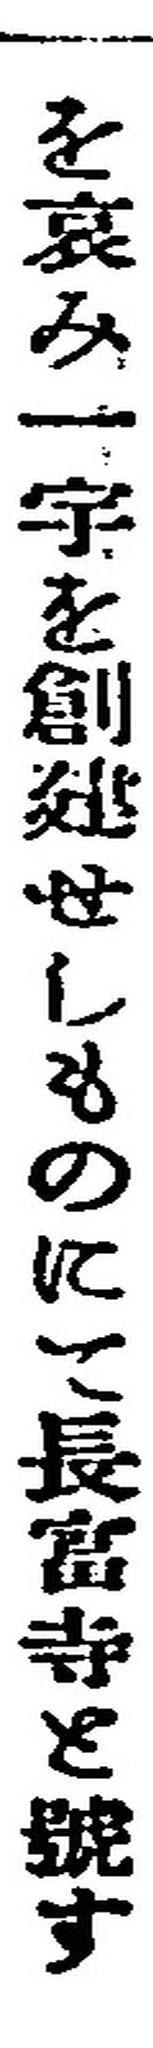を哀み一宇を創建せしものにて長富寺と号す
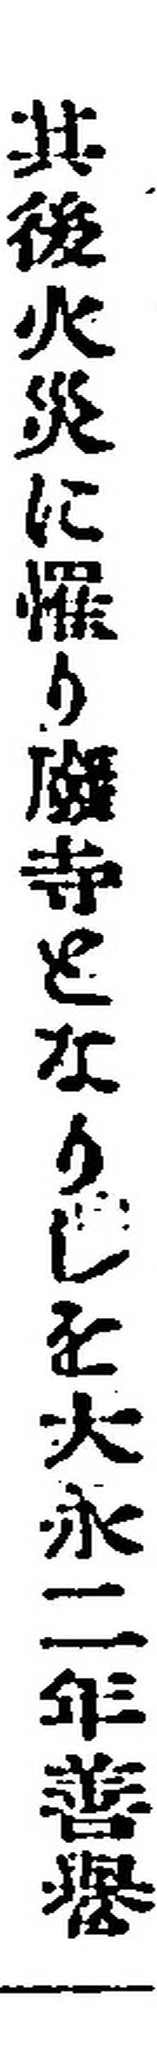其後火災に罹り廃寺となりしを大永二年善誉
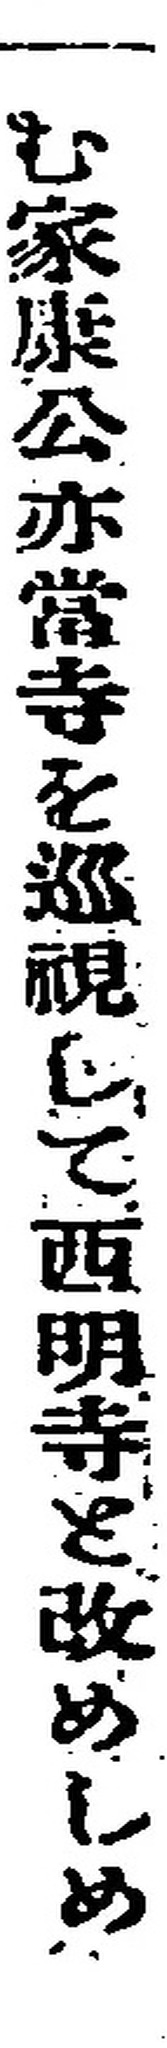む家康公亦当寺を巡視して西明寺と改めしめ
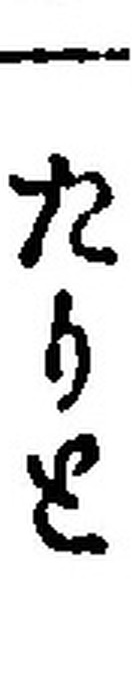たりと
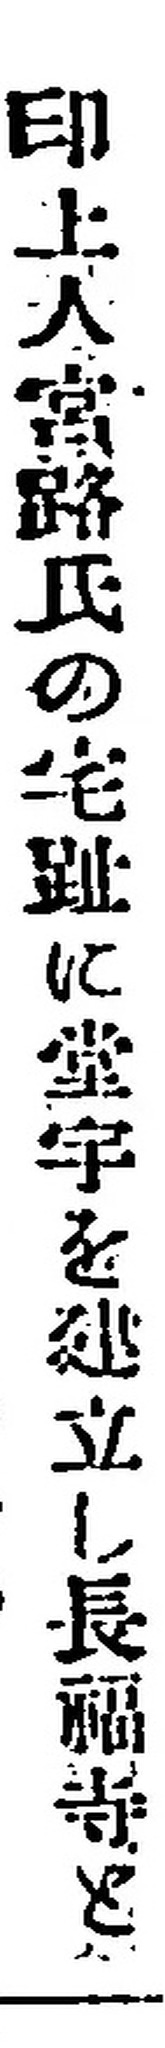印上人宮路氏の宅趾に堂宇を建立し長福寺と
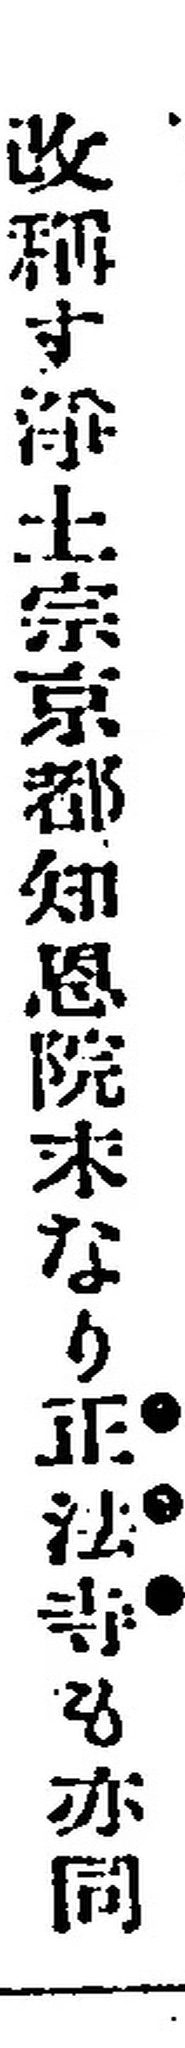改称す浄土宗京都知恩院末なり正法寺も亦同
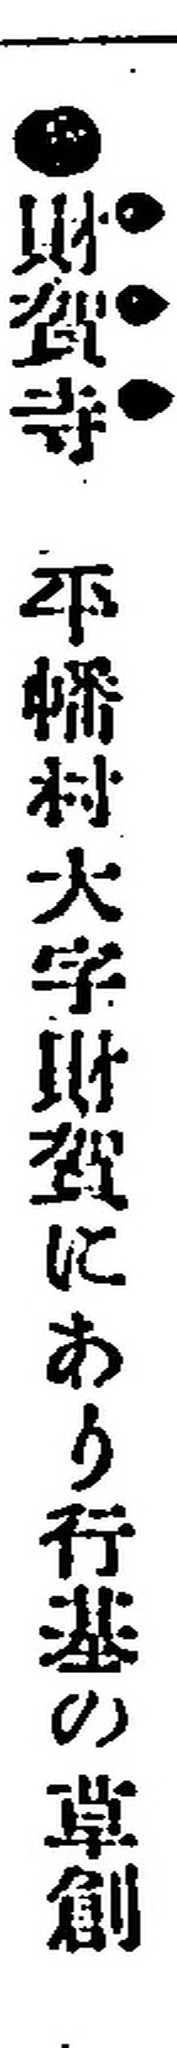●財賀寺平幡村大字財賀にあり行基の草創
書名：東参名勝案内
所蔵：国立国会図書館 National Diet Library, JAPAN
